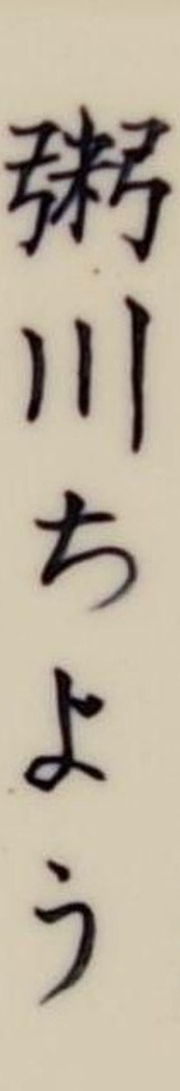粥川ちよう
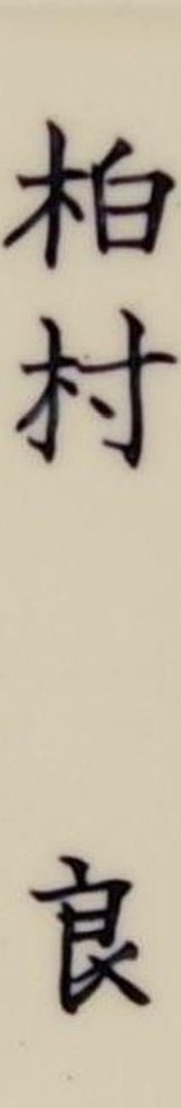柏村良
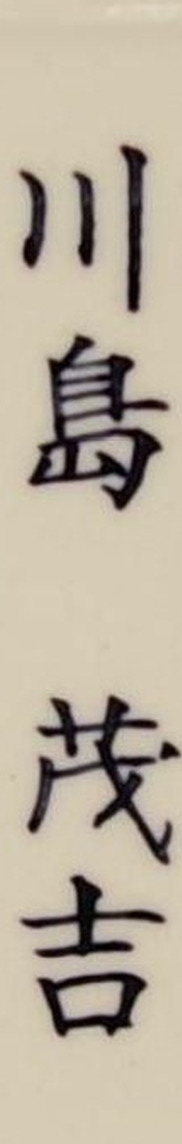川島茂吉
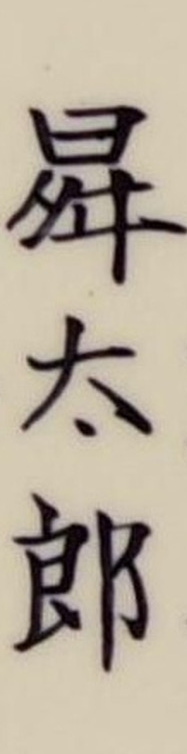昇太郎
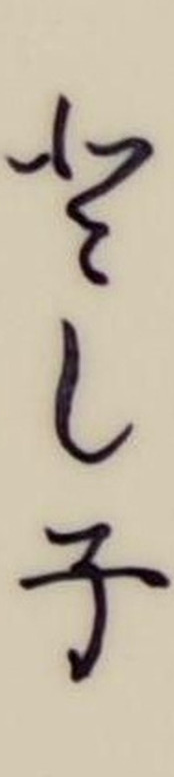とし子
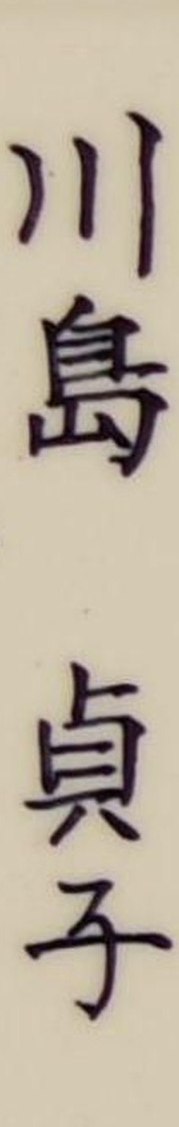川島貞子
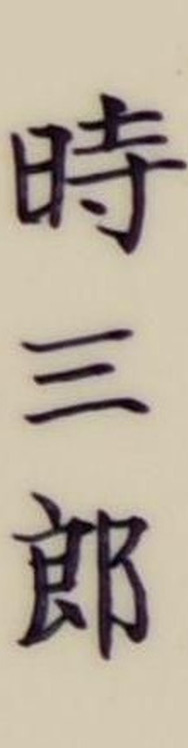時三郎
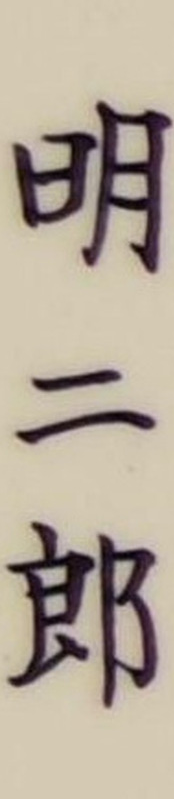明二郎

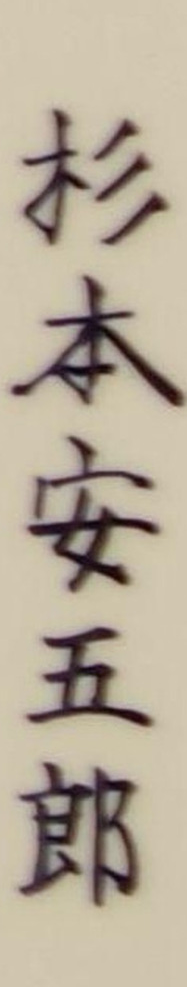杉本安五郎
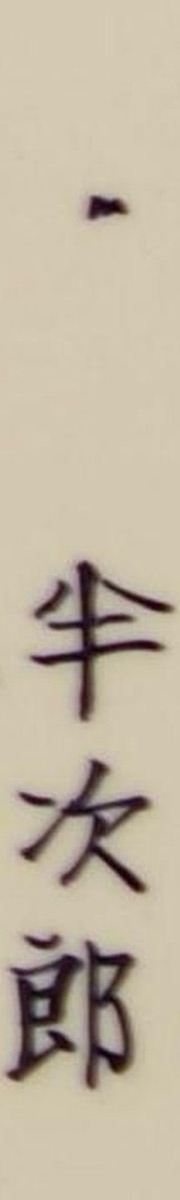半次郎
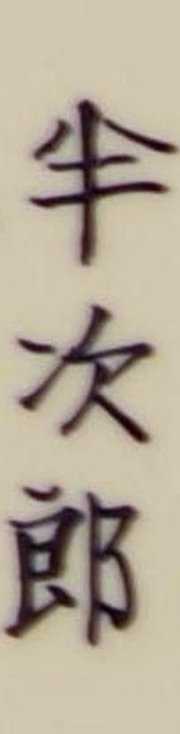半次郎
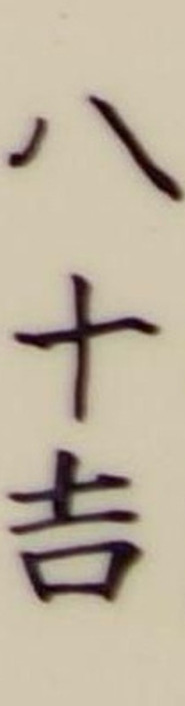八十吉
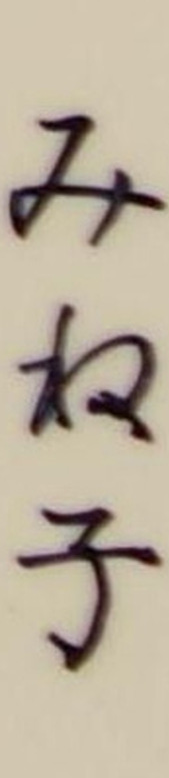みね子
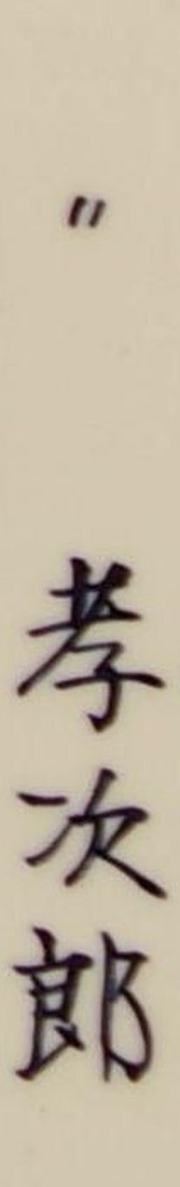孝次郎
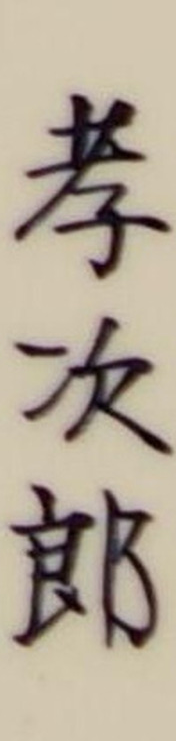孝次郎
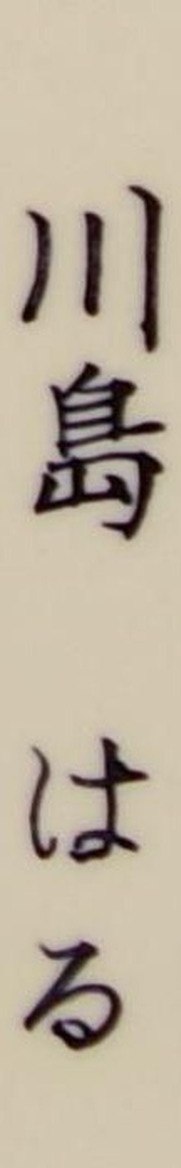川島はる
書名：E~L
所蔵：高野山金剛峯寺
